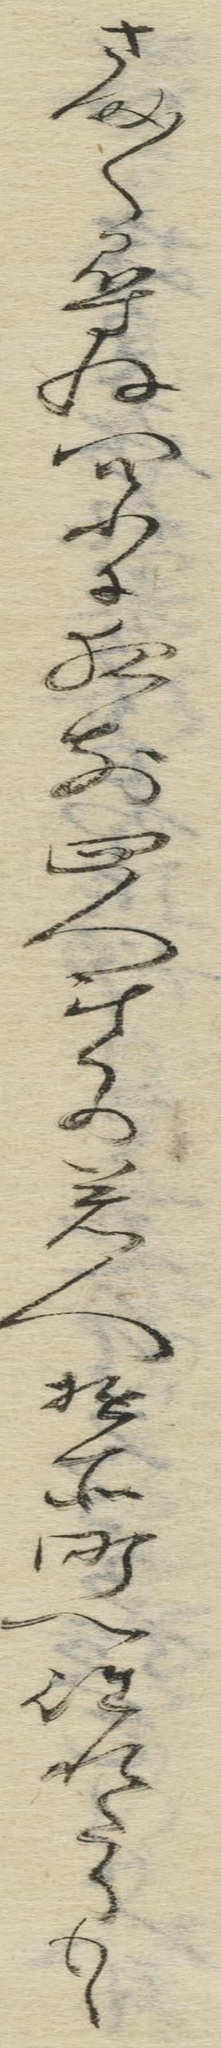さま〳〵尋ね問ふに夜前四人計りの若人遊所町へ往れたりも
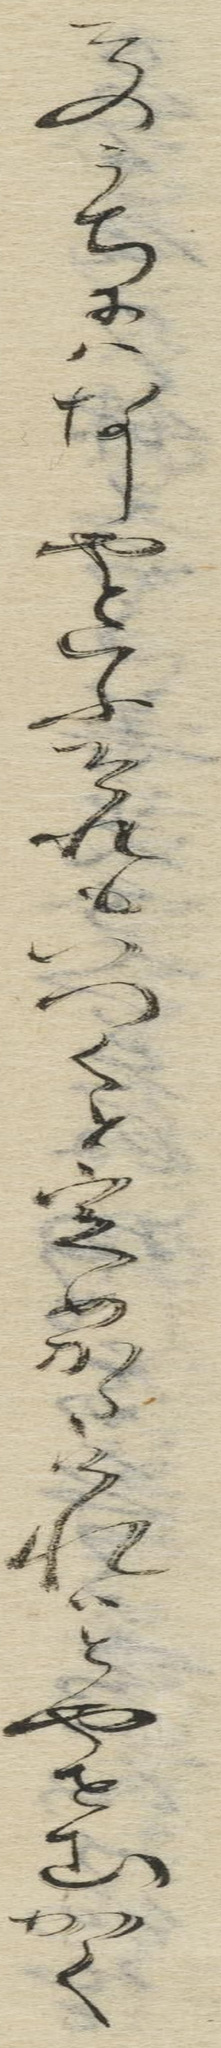そのうちにハなしやといふそれもいつくと定めかたけれハとやをむかく
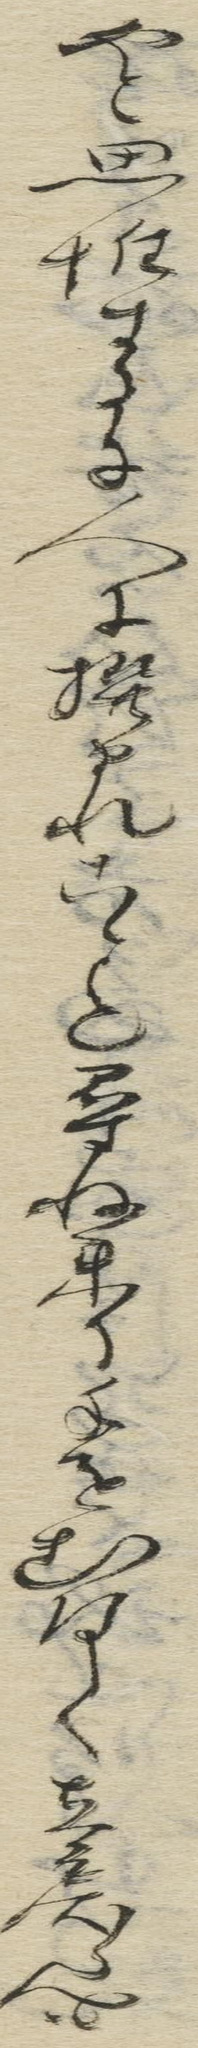やと思惟するに人に選われこゝ迄尋ね参り手をむなしく立戻らんも
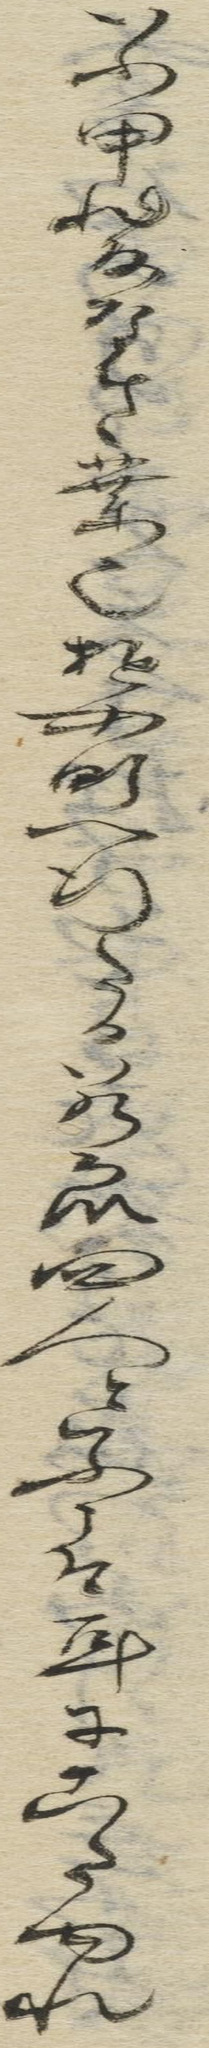いふ甲斐なき業也遊女町へ行たる若衆四人と承とそ耳にこたゆれ
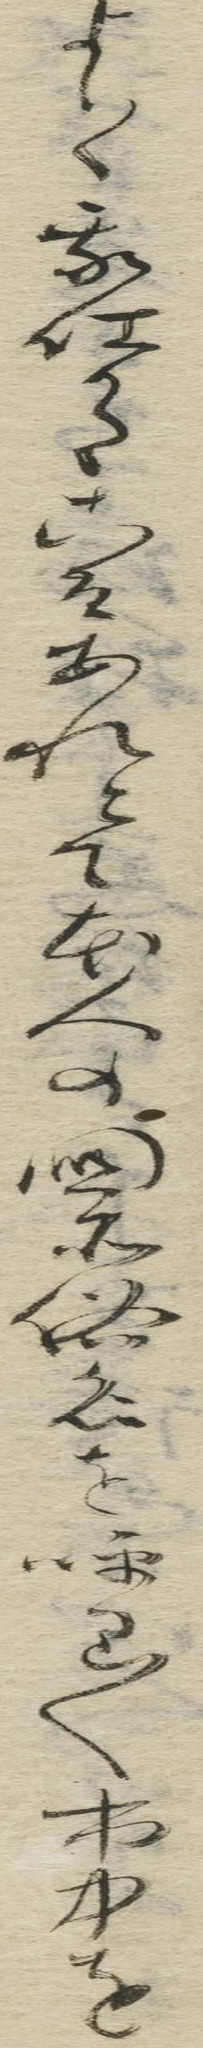よく〳〵我仕たくこそあれとて本人の国名俗名を呼色々市中を
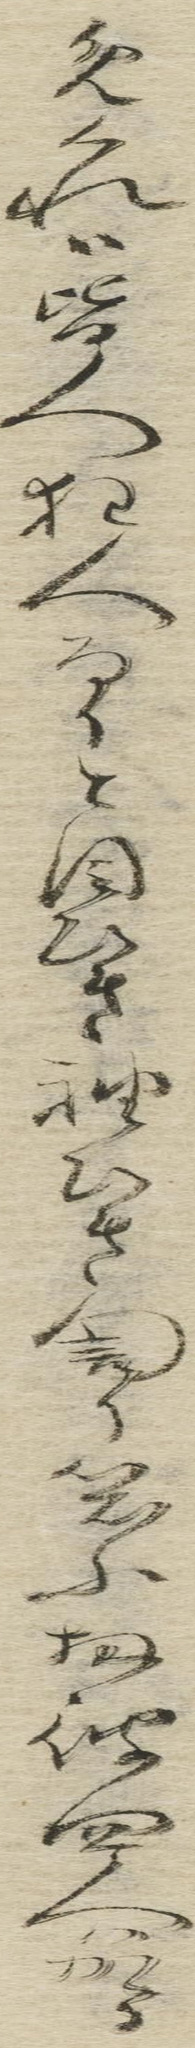めくれハ皆人犯人なりと目ひき袖ひき訇り笑ふ扨彼四人ハかゝる
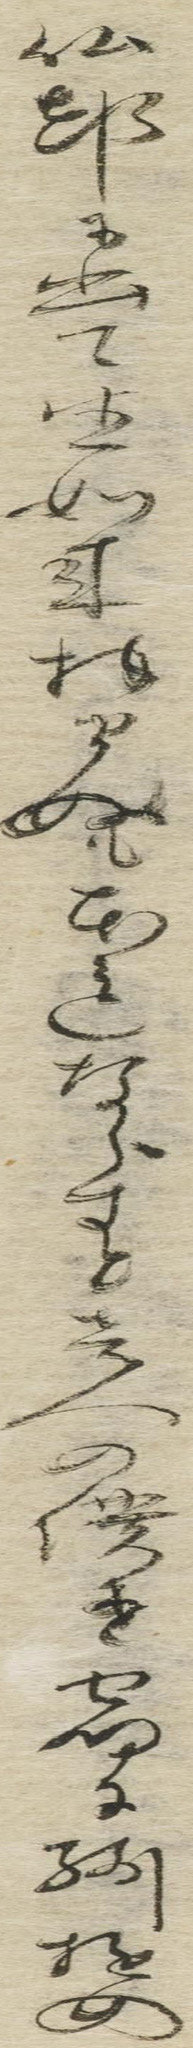仏郭に出て生如来遊ゆぬも本意ならすと壱人の僕は宿に残し遊女
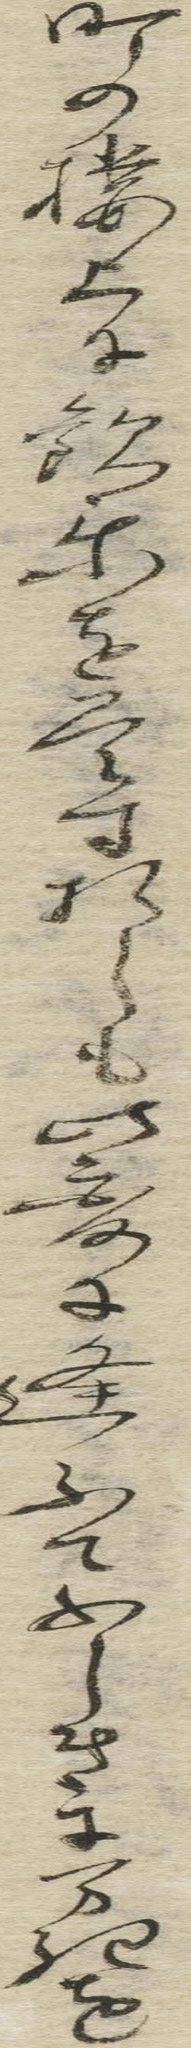町の楼上に歓楽を尽す折しも此変に逢ふて少しきに万死を
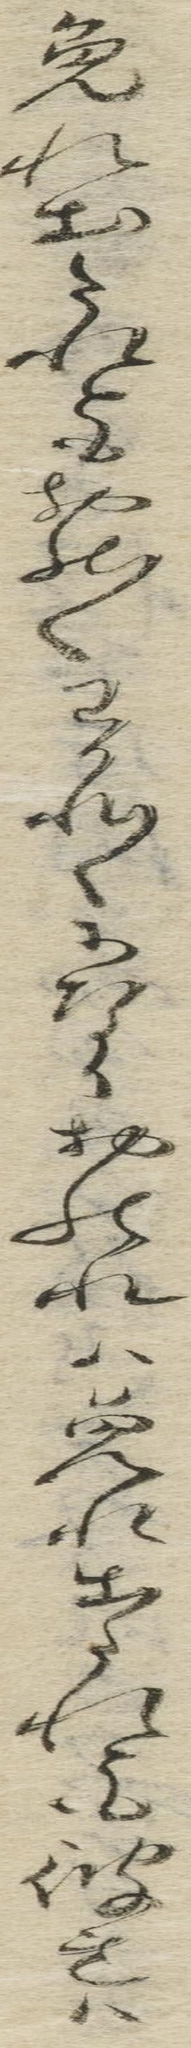免れ出たれともおの〳〵わかれ〳〵になりおのれハ免れ出たれとも彼らハ
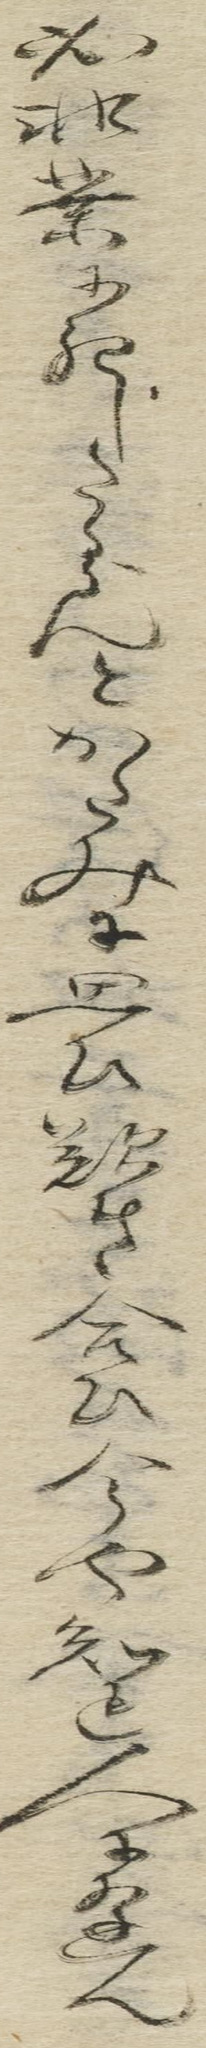必非業に死したるらんとかたみに思ひ歎き合ひ今や知れ人に逢ん
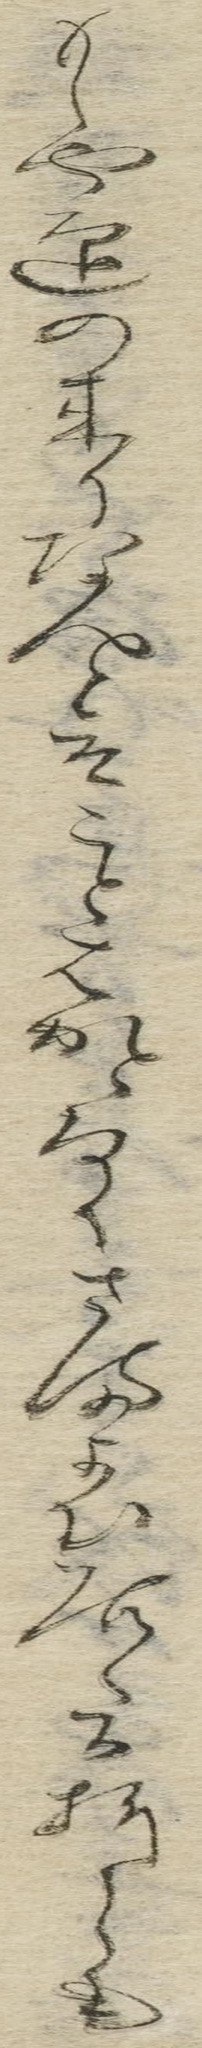もしや迎の来りなんとそこゝとはかりなくさまよひ居る折しも
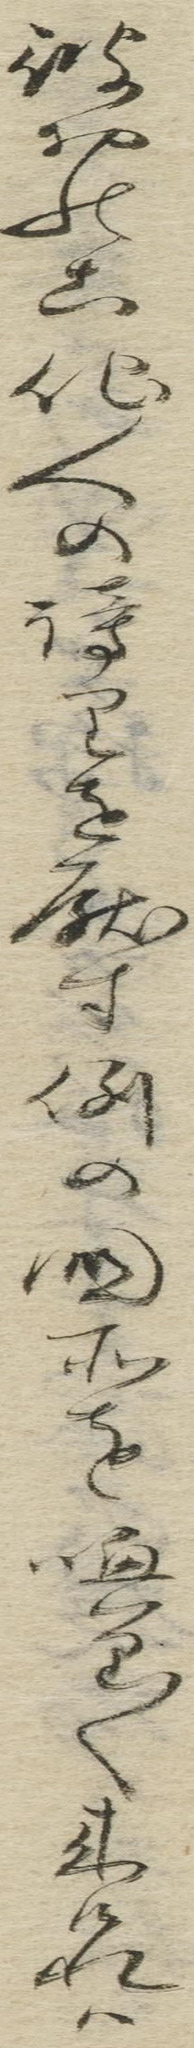彼おのこ他人の謗りを厭す例の囲所を喚色〳〵参けれハ
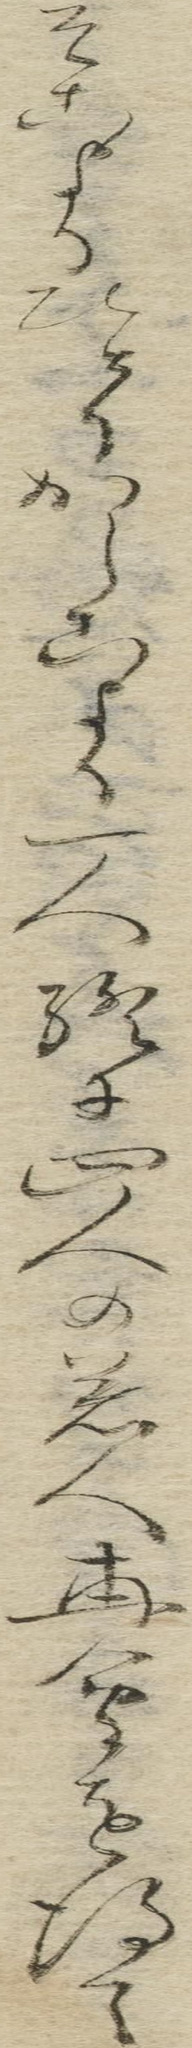そこよりひとりかしこより一人終に四人の若人再会を得て
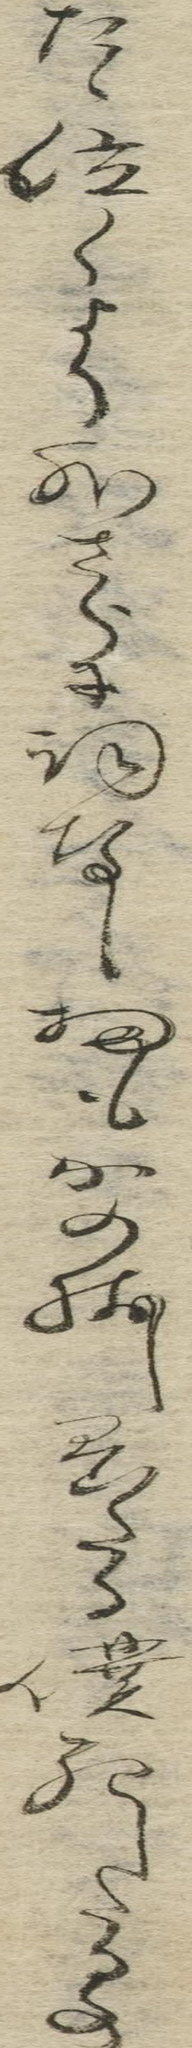たゝ泣くより外さらに調なし扨もかの残し置たる僕死したる事

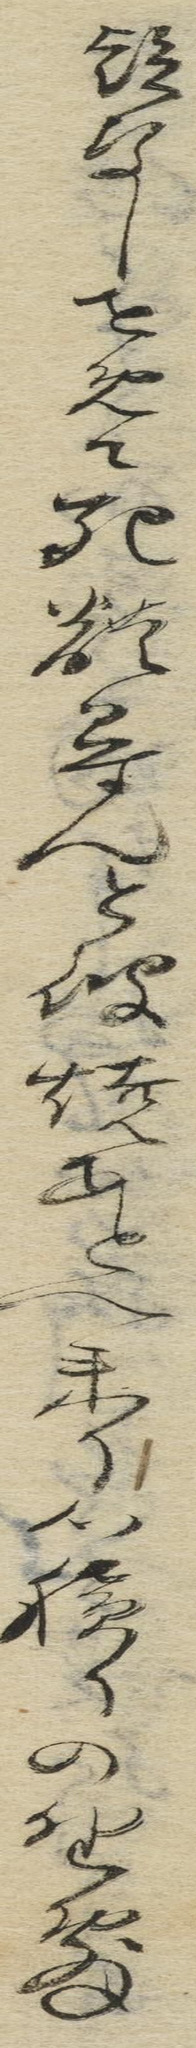疑なしを見て死體尋んと彼焼あとへ参り心積の坐敷
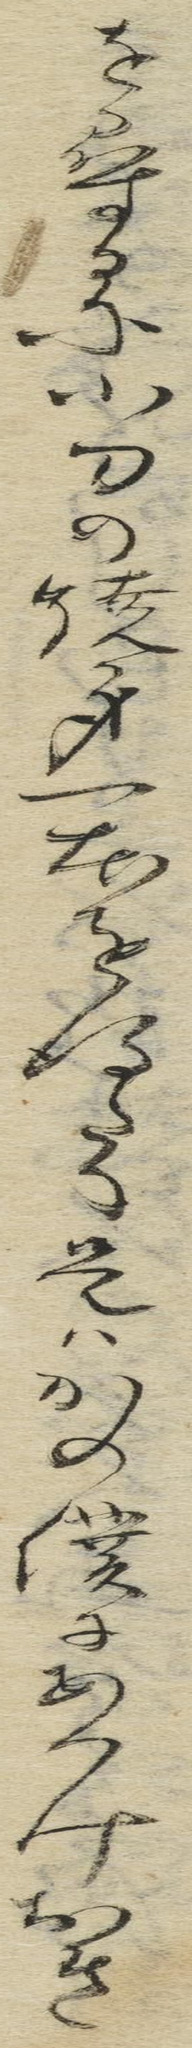を尋るに小刀の焼身一本を得たり是ハかの僕にあつけおき
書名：弘化丁未天變日記
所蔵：東京大学地震研究所図書室 Earthquake Research Institute Library, The University of Tokyo, JAPAN
